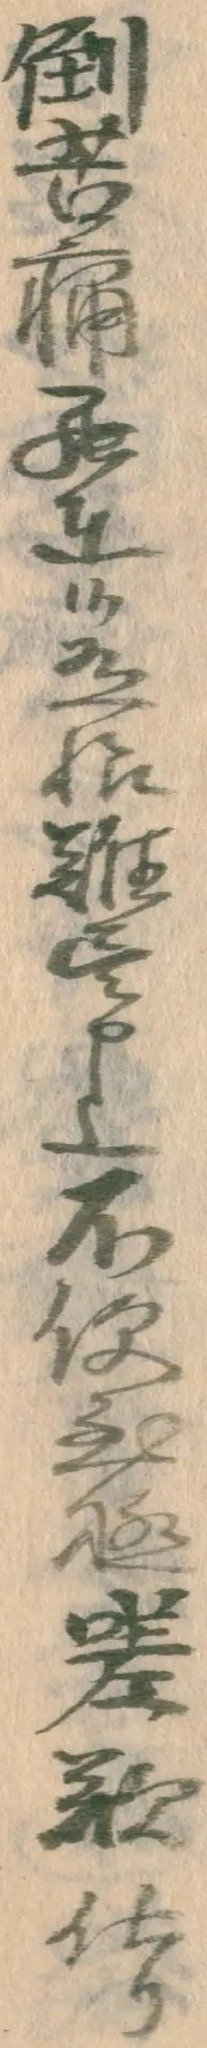倒苦痛罷在候有様難尽申上尽不便至極嗟歎仕り
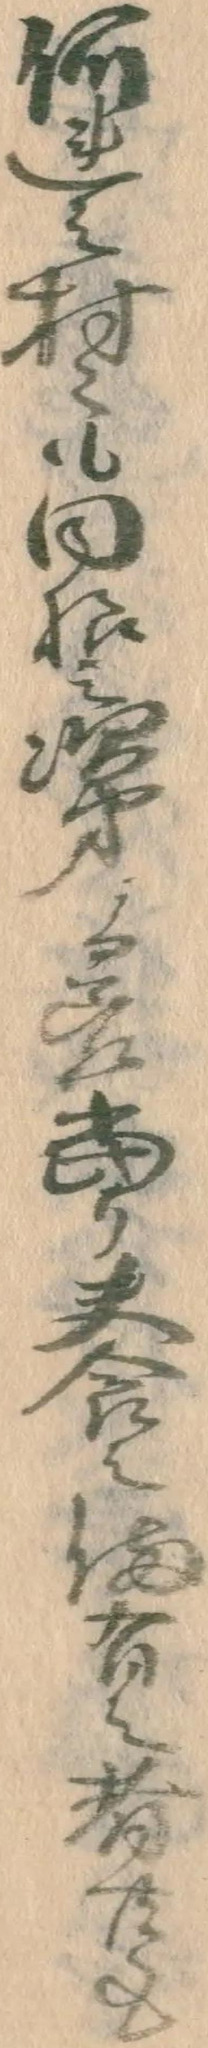何れ之村々も同様之次第ニ而差当り夫食之備有之者共も
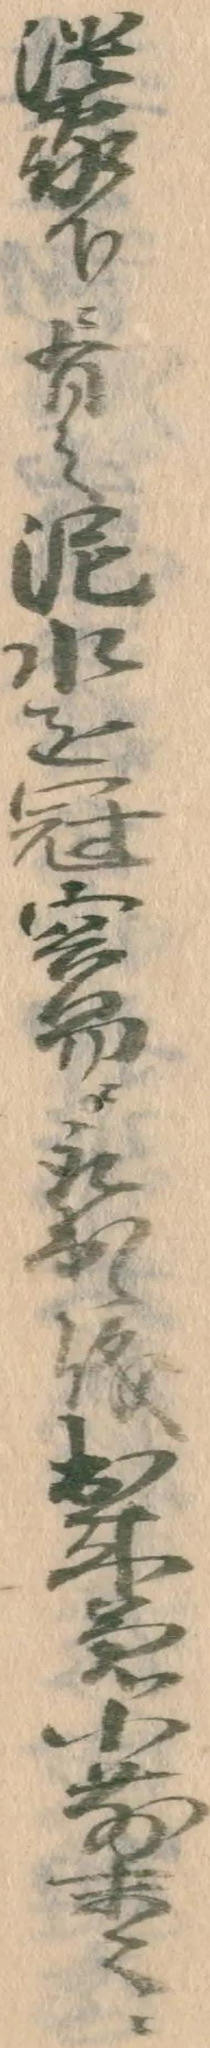潰家之下ニ有之泥水を冠り容易ニ取出候儀出来兼小前等々ニ
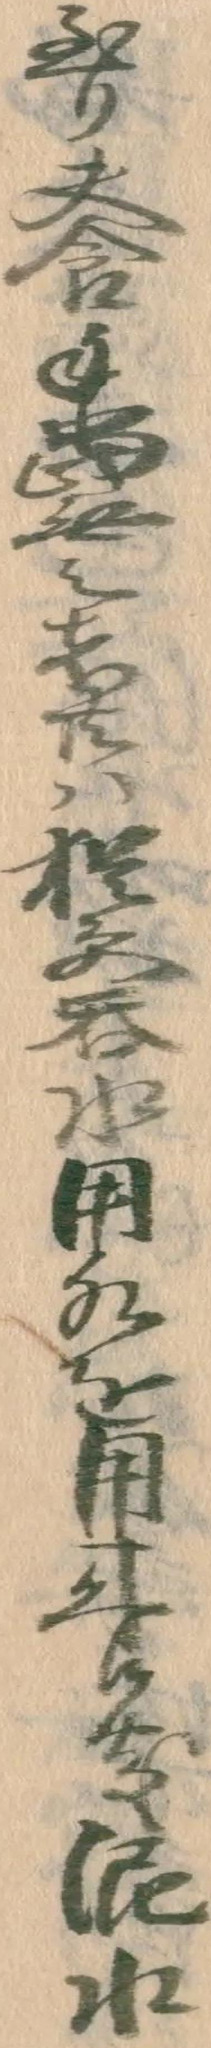至り夫食手当無之者共ハ猶又呑水ハ用水を用来候処泥水
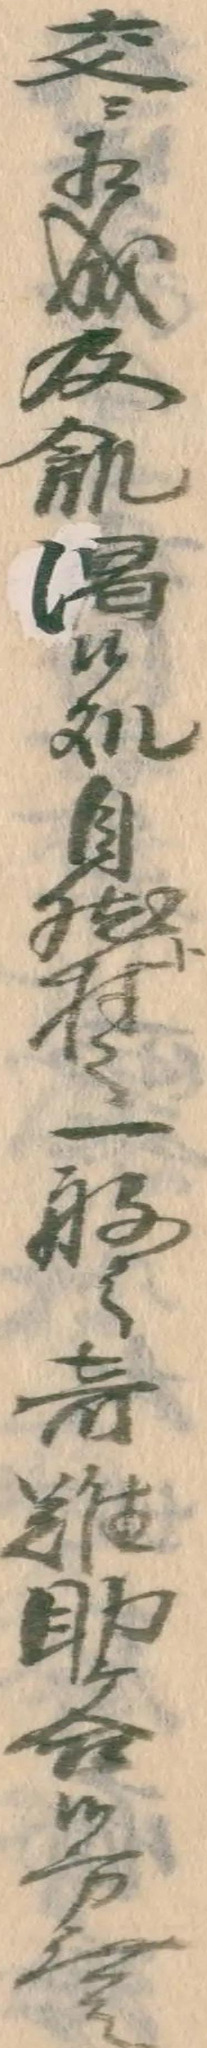交ニ相成及飢餲候処自然村々一般之奇難助合候方無之
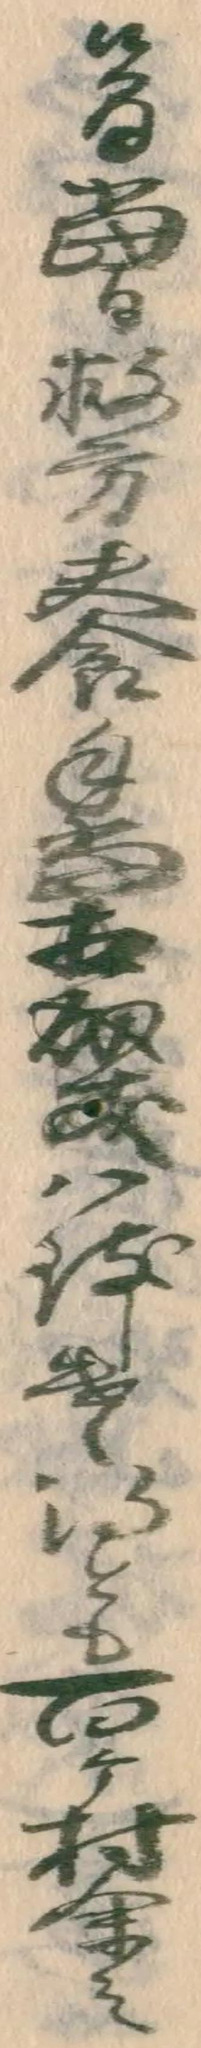候間当日救方夫食手当相成丈ハ致し遣候得とも百ケ村
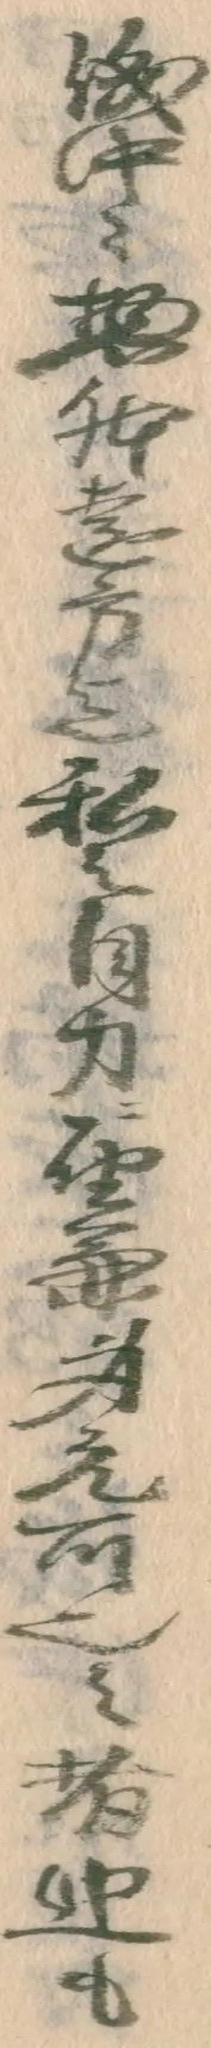儀惣躰救方迄私之自力ニ届兼身元可也之者迚も
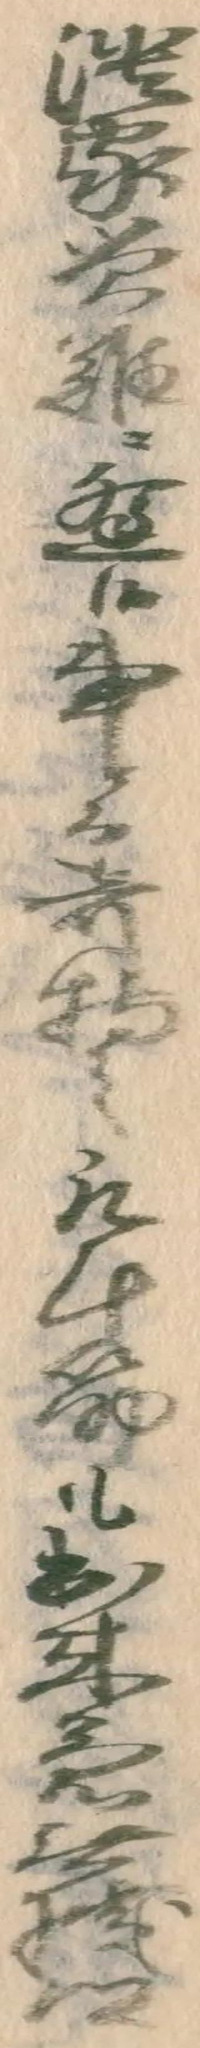潰家災難ニ逢候事ニ而奇特之取斗も出来兼無拠郷
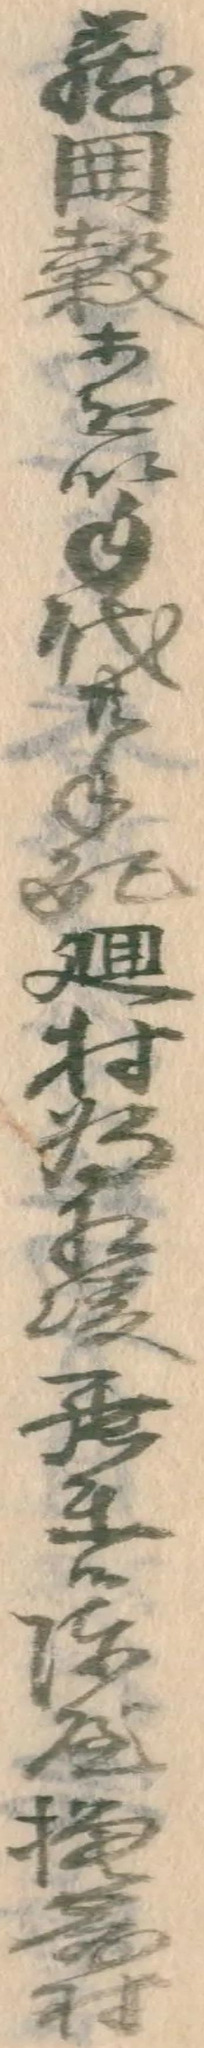蔵囲穀等を以手代共手配廻村為相凌罷在候陣屋挹寄村
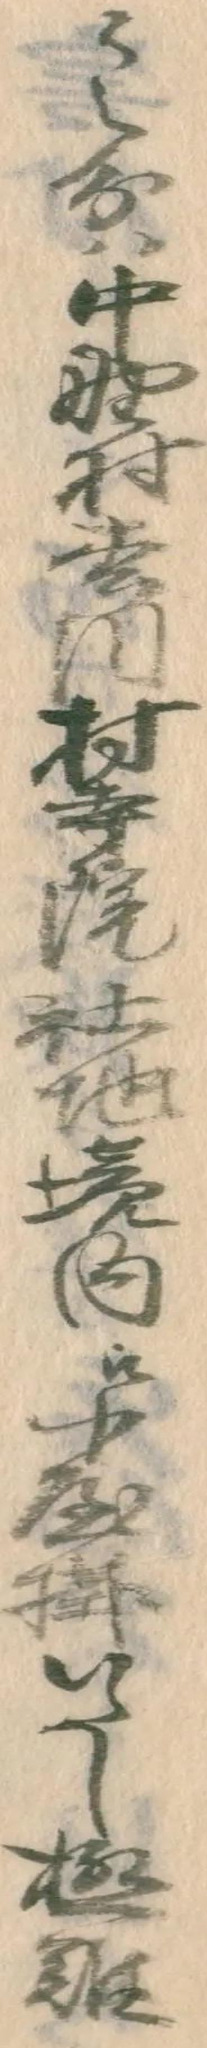々之分ハ中野村松川村寺院社内境内江小屋掛いたし極難
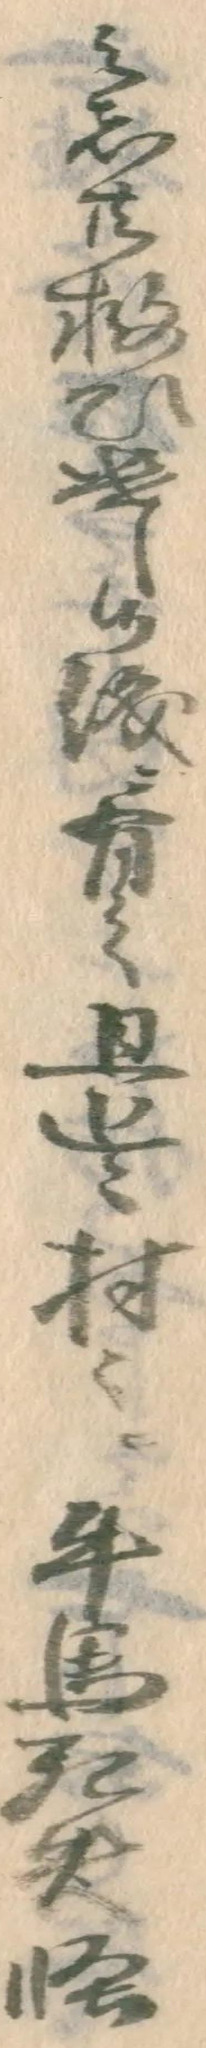之者共救遣し候儀ニ有之且追々村々二牛馬死失怪
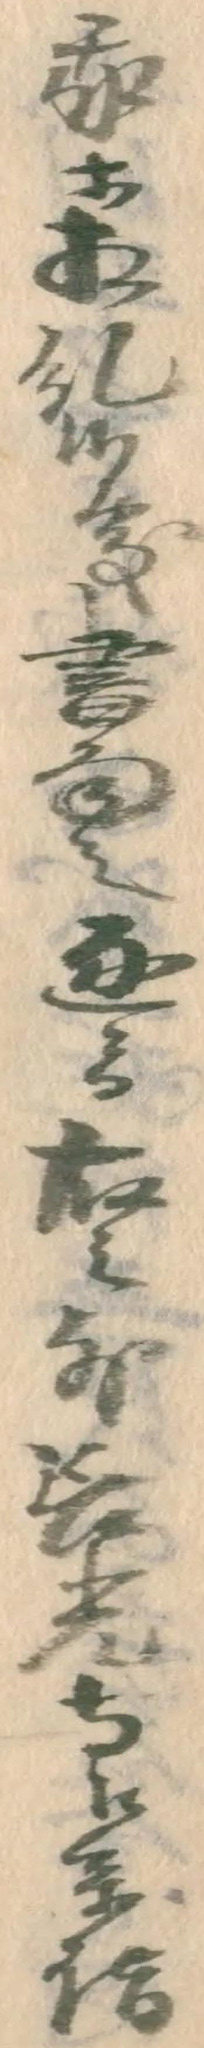我等相糺候処書面之通ニ而右之外善光寺参詣
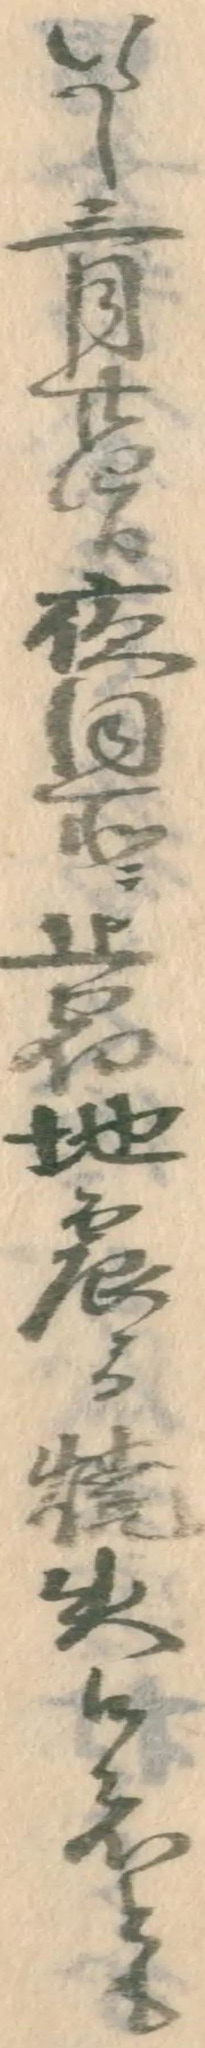いたし三月廿四日夜同所ニ止宿地震ニ而焼失候者とも

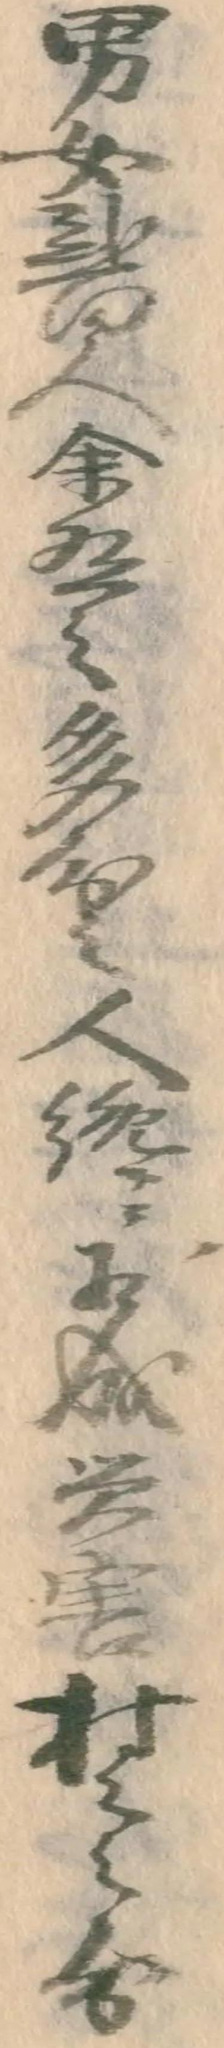男女弐百人余有之多分之人絶ニ而相成災害村々之分
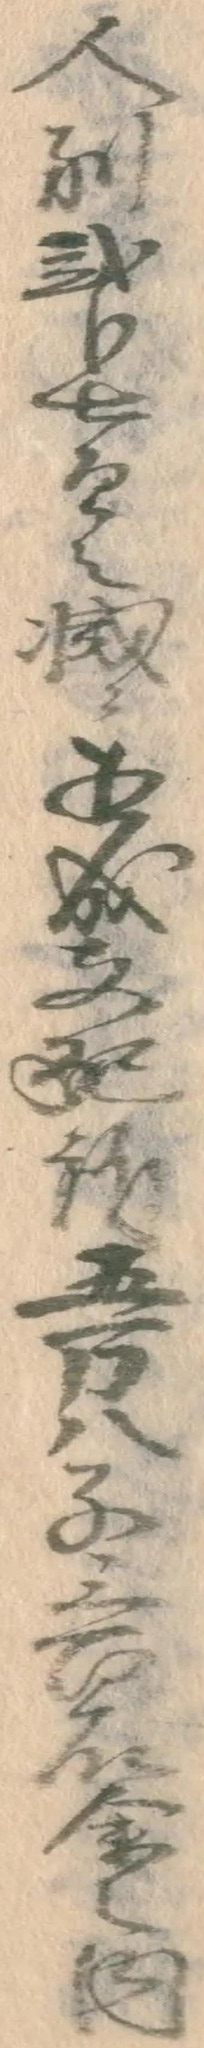人別弐歩七厘之減ニ相成支配所高五万八千三百石余之内
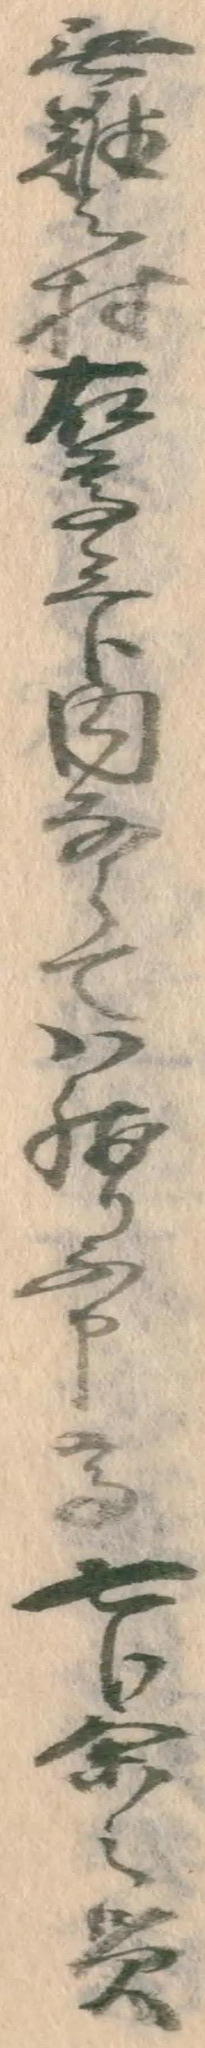無難之村右高三分内ならてハ残り不申高七分余之災
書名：信州大地震之記
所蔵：国立国会図書館 National Diet Library, JAPAN
